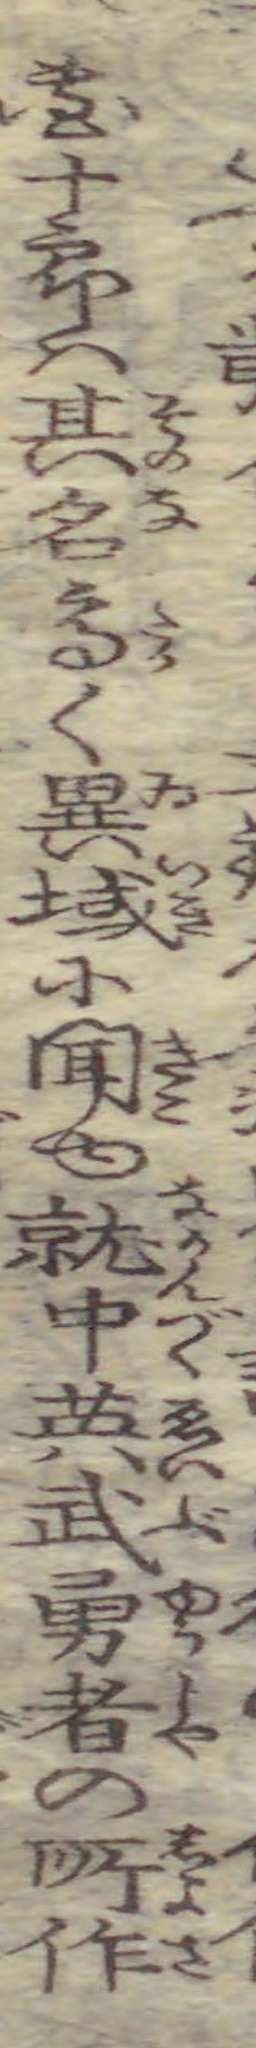團十郎は其名高く異域に聞ゆ就中英武勇者の所作
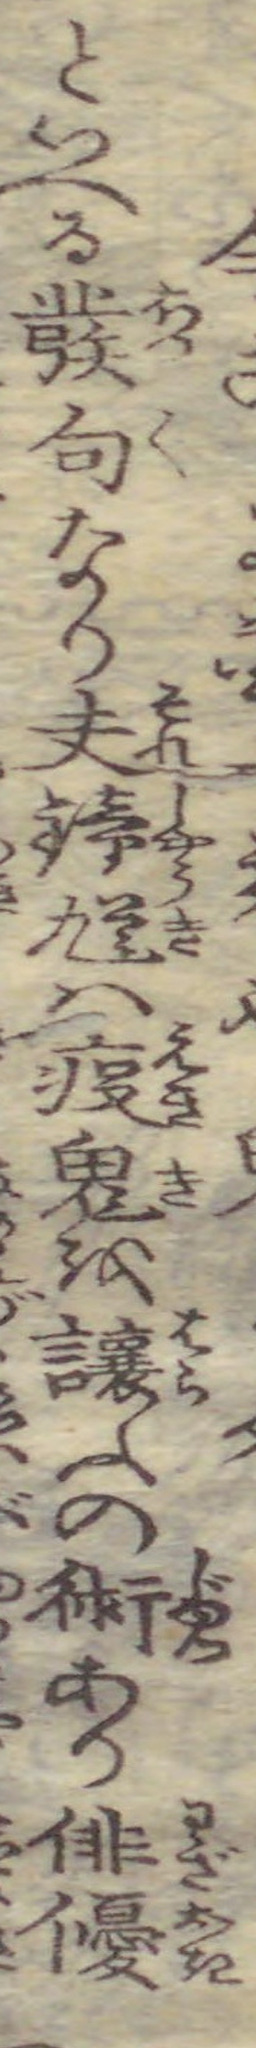といへる発句なり夫鍾馗は疫鬼を譲ふの術あり俳優
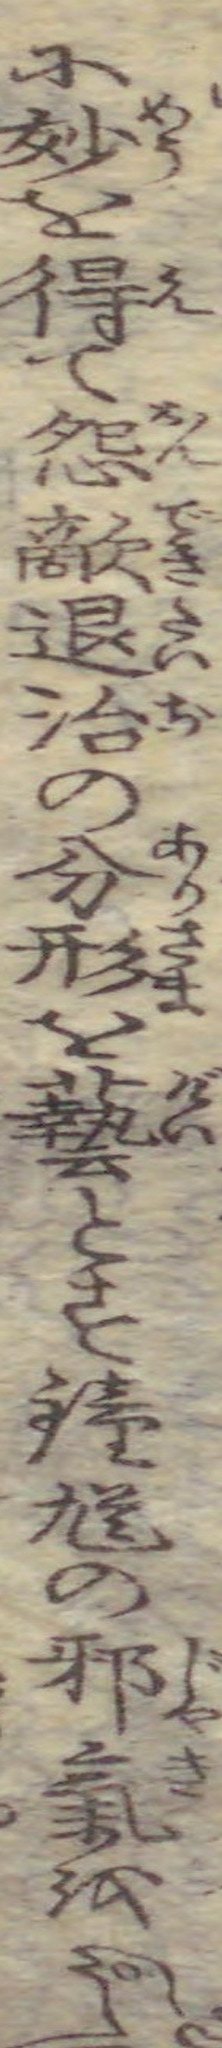に妙を得て怨敵退治の分形を芸とす鍾馗の邪気を
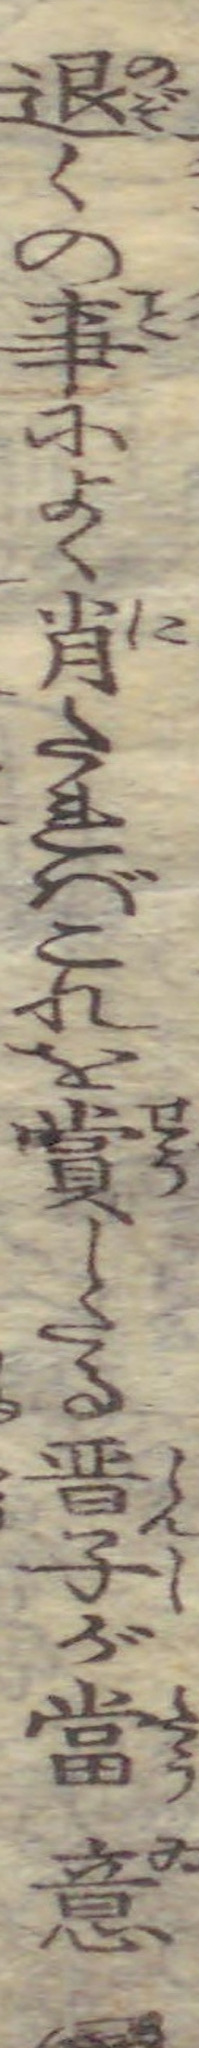退くの事によく肖たればこれを賞したる晋子が当意
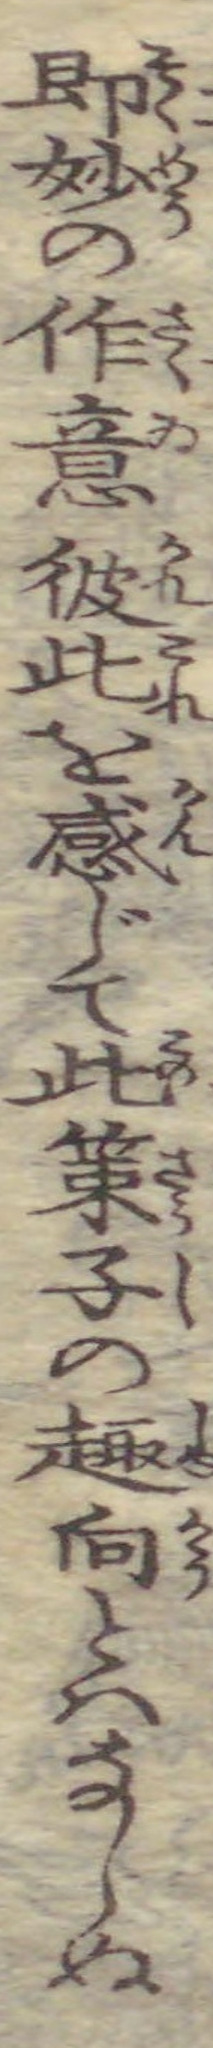即妙の作意彼此を感じて此草子の趣向とはなしぬ
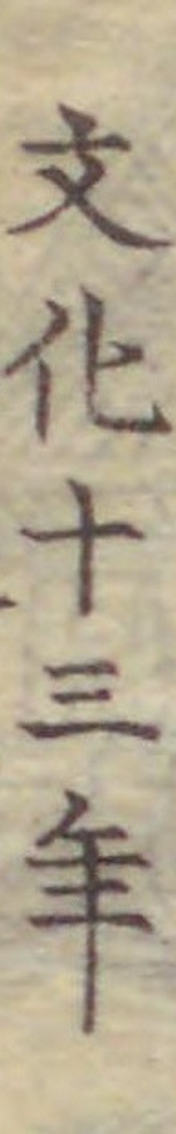文化十三年
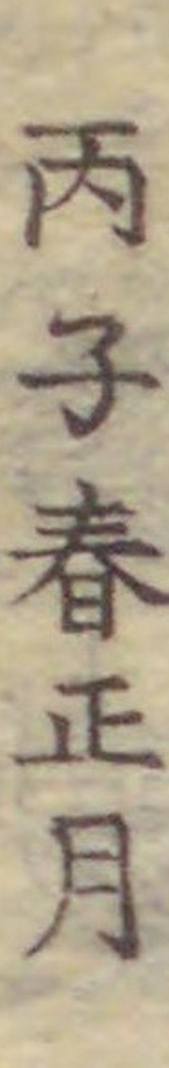丙子春正月
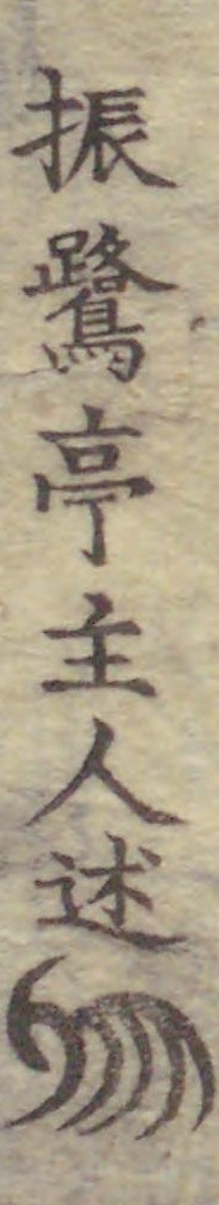振鷺亭主人述

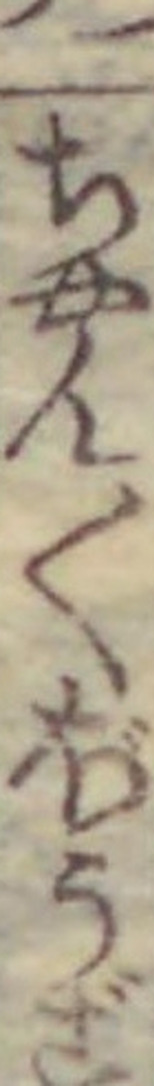ちやん〳〵ぼうず
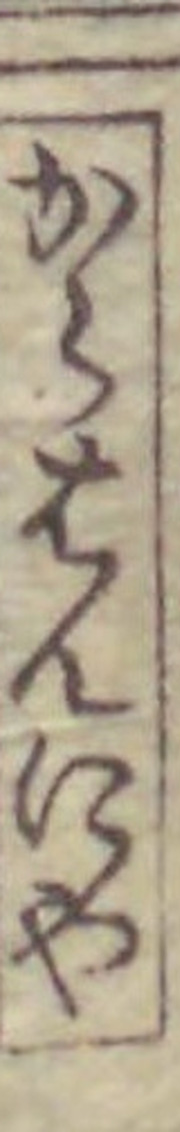からはんにや
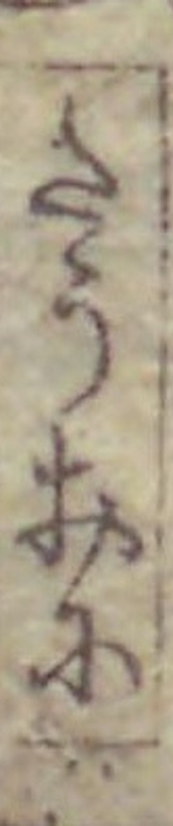たうおに
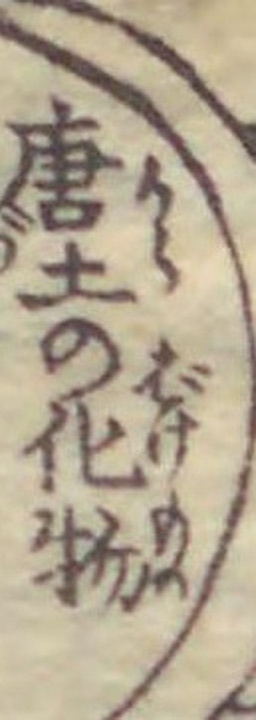唐土の化物
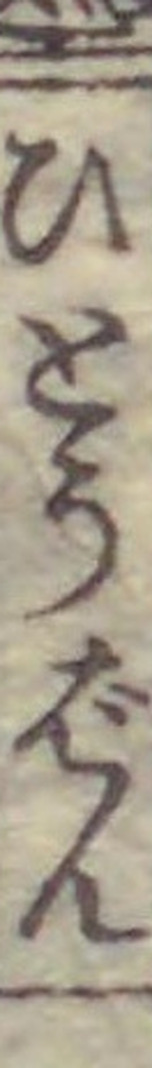ひとうばん
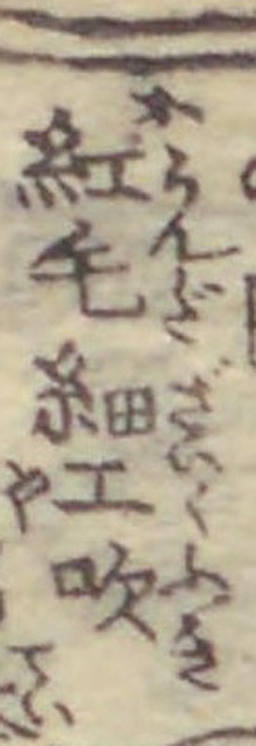紅毛細工吹
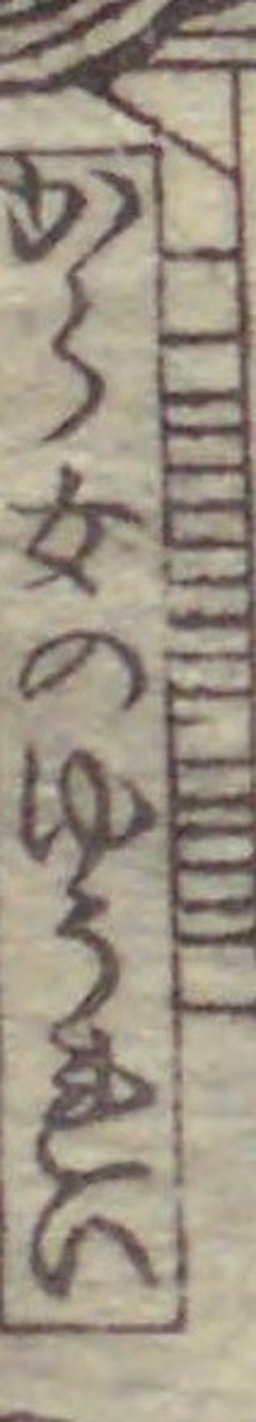から女のゆうれい

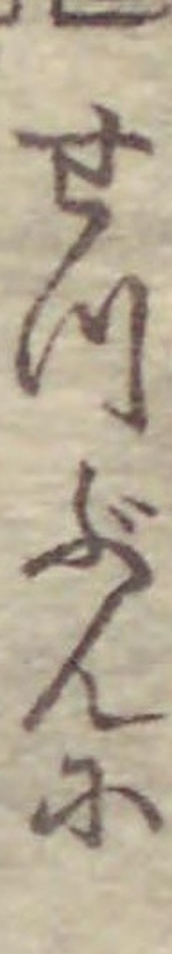せつぶんに
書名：大時代唐土化物 3巻. 曽我太夫染
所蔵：国立国会図書館 National Diet Library, JAPAN
